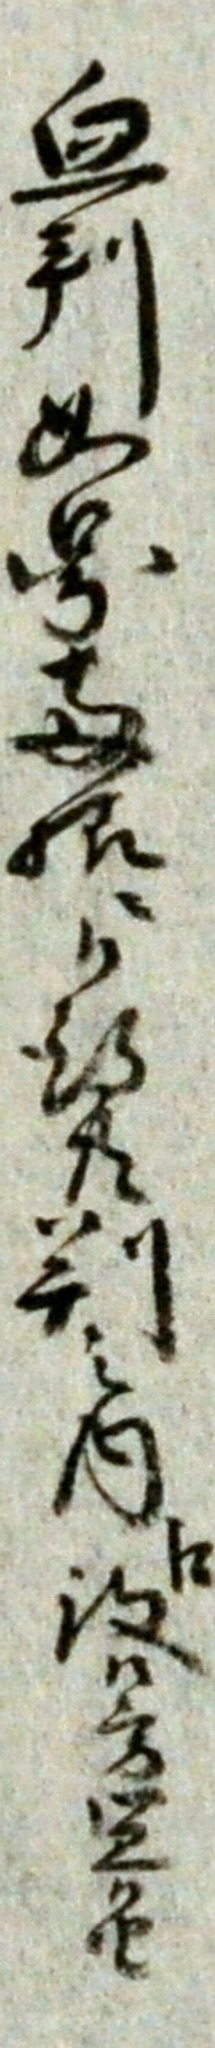血判如図両様ニ候得共判之内江致候方宜ク由
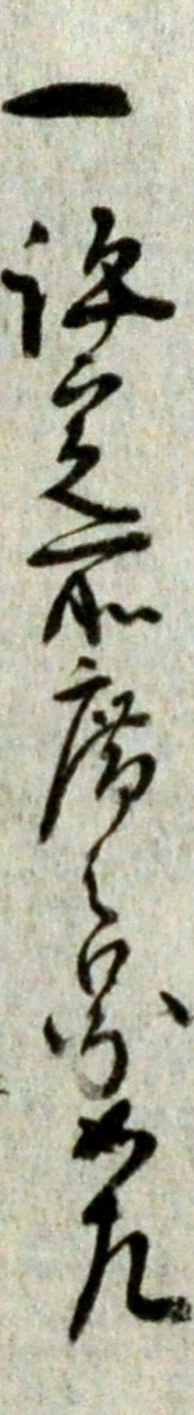一評定所席之図如左

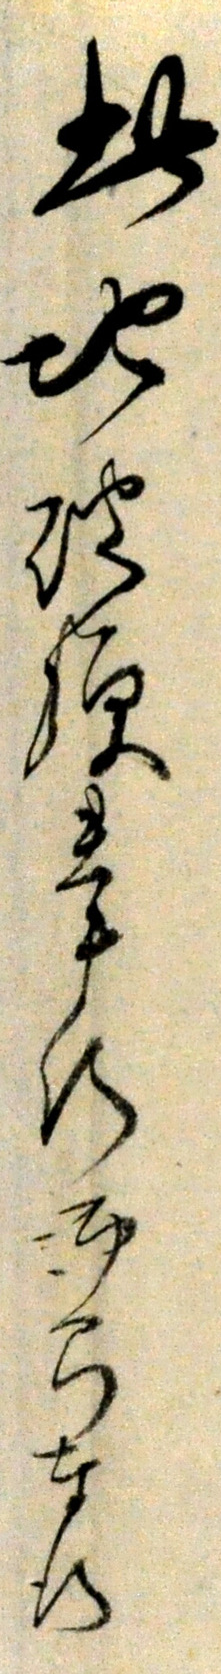此地破損奉行御弓奉行
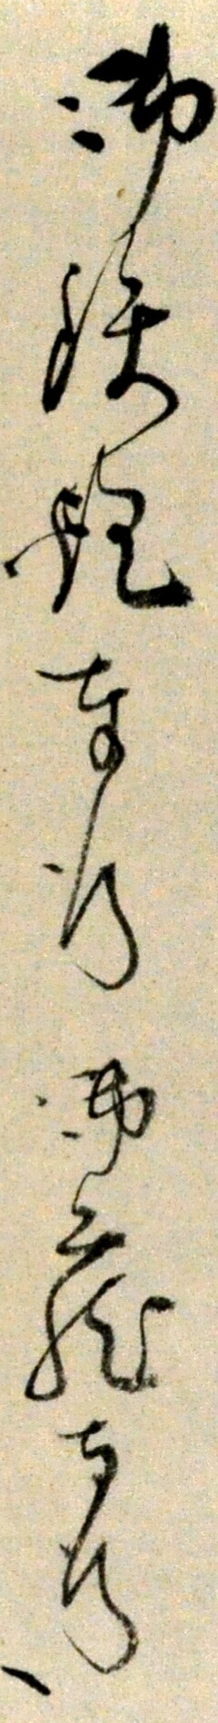御鉄炮奉行御蔵奉行へ
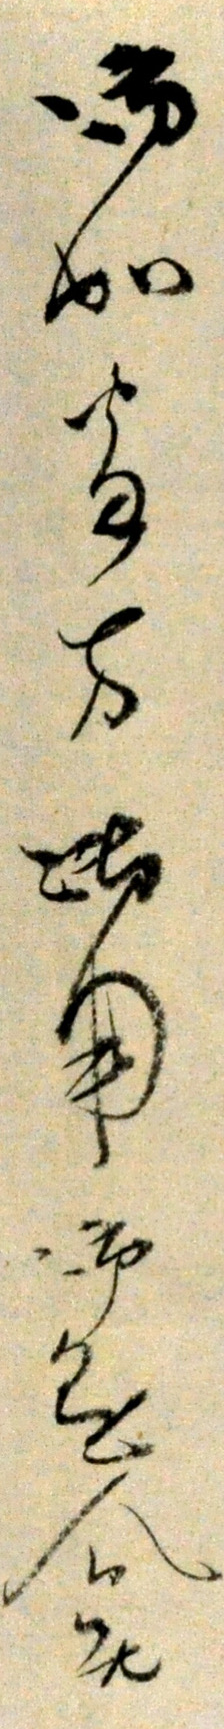御加番方御用御懸合并
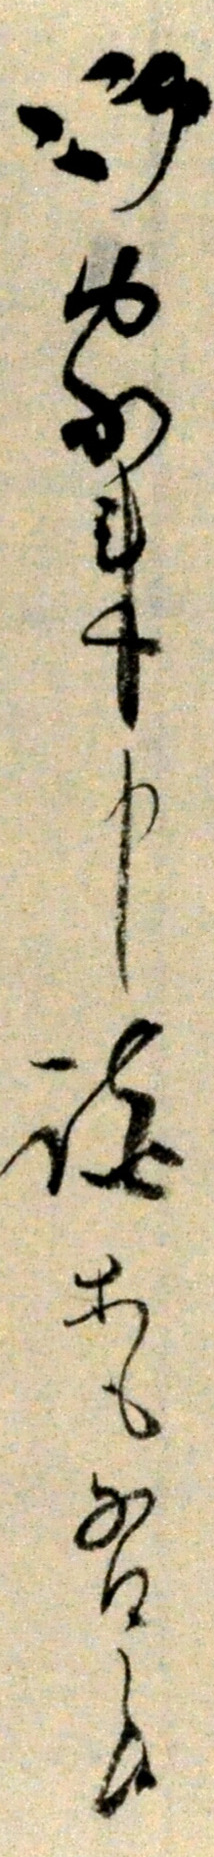御家来申談等も有之候
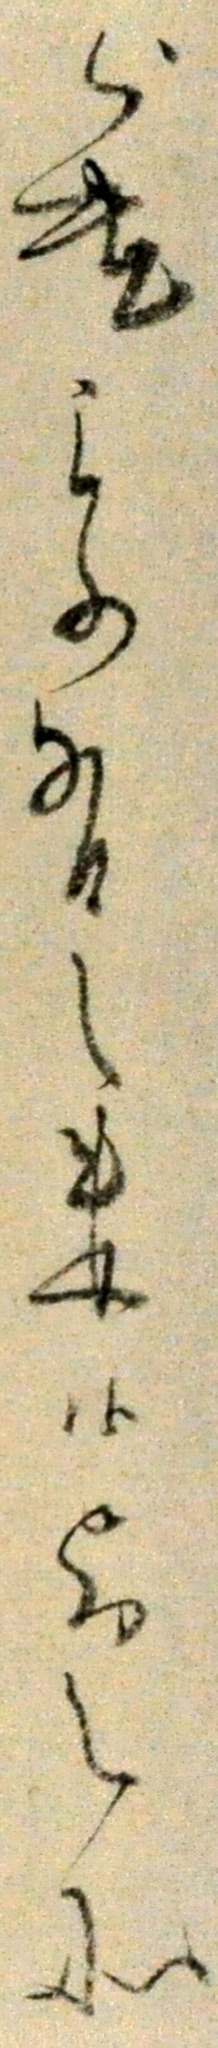被遣もの有之来候旨之所
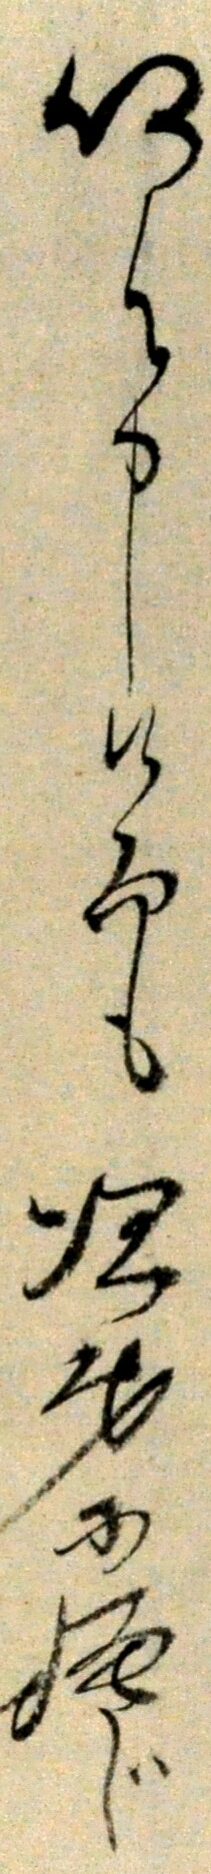何と申し候而も次第に贈じ
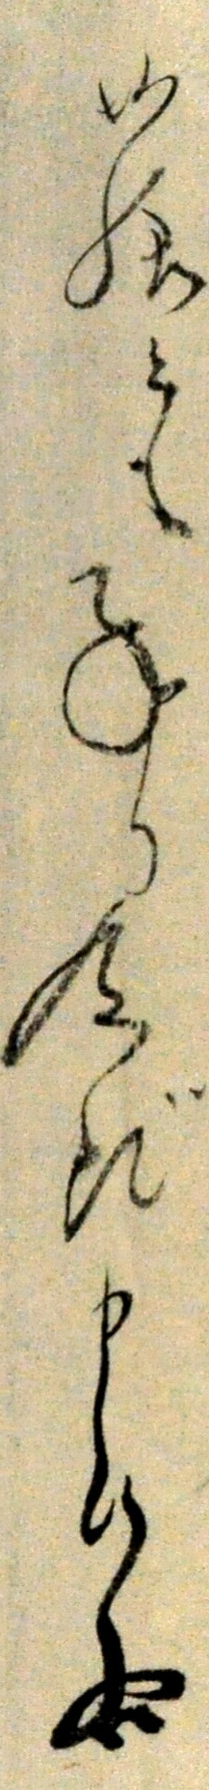候様とも承り及び申し候右
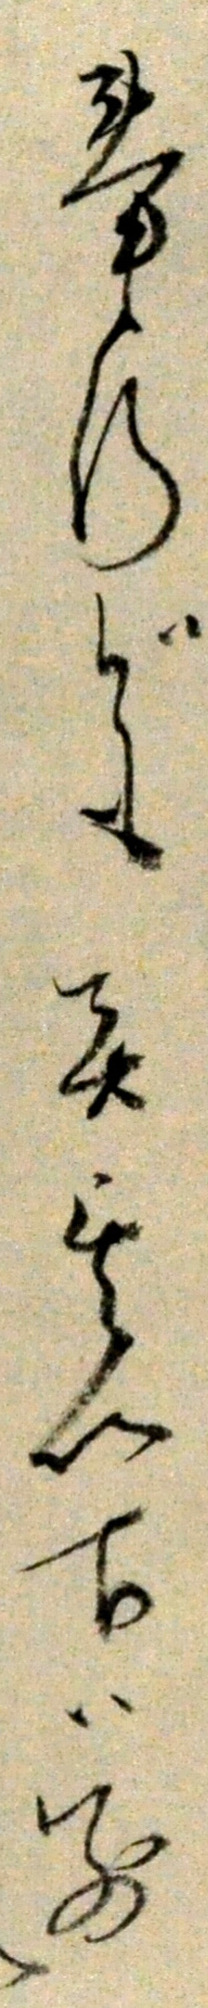奉行ども并其以下ㇵ別して
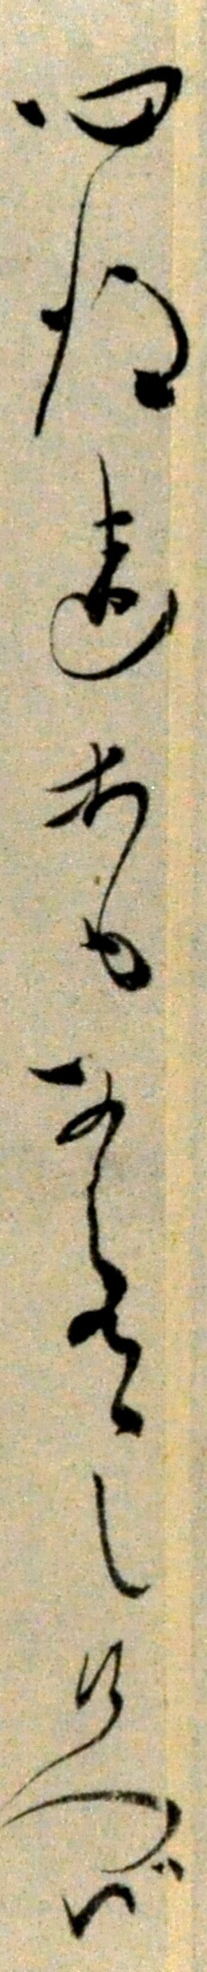心得違等も可有之候へバ

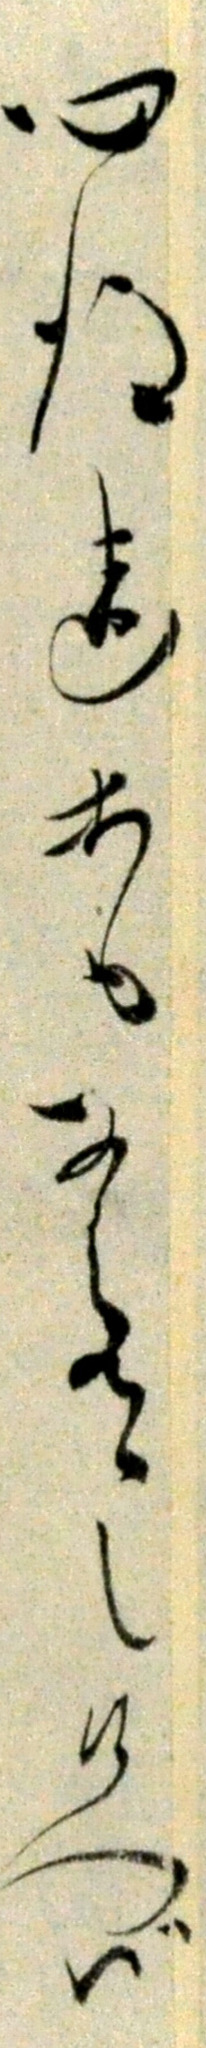心得違等も可有之候へバ
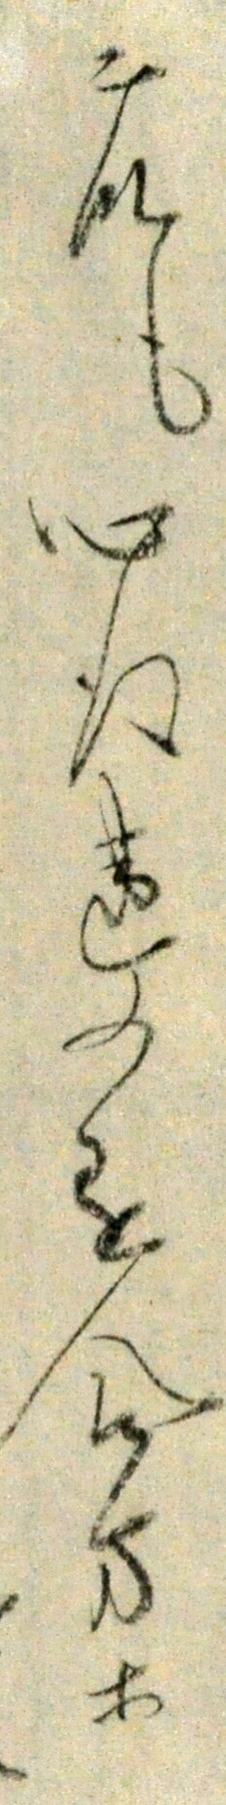衆も心得違の懸合方等をも
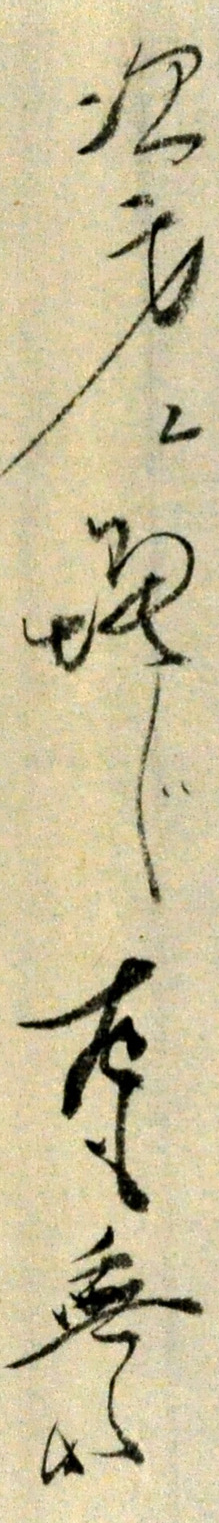次第ニ贈じ左も無之候
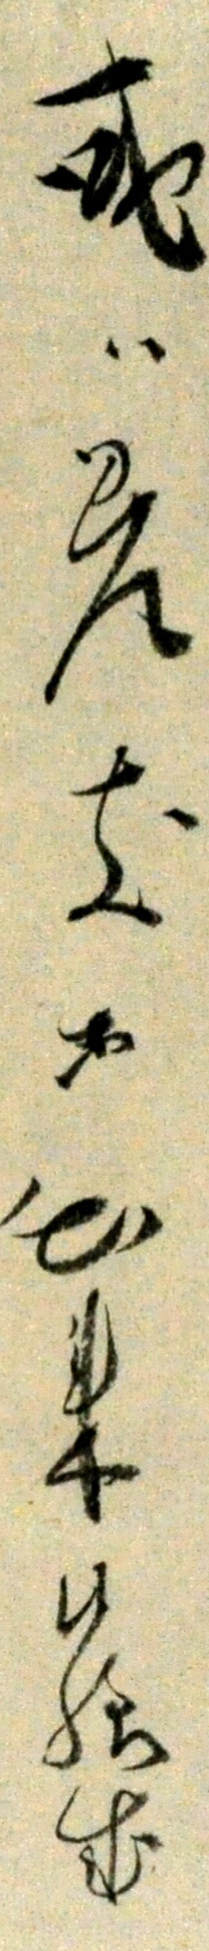或ハ差支等出来候様成
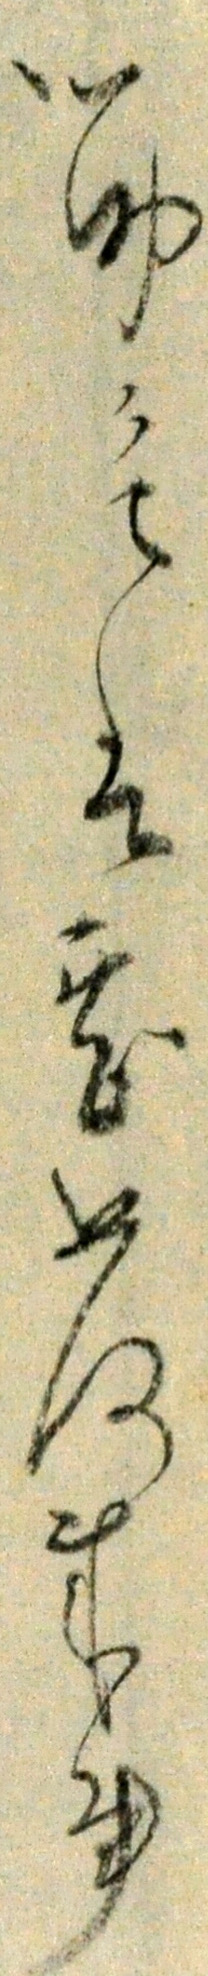筋候ては甚如何成事
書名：大阪加番関係諸書留〔一括〕
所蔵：伊那市立高遠町図書館・合同会社AMANE
